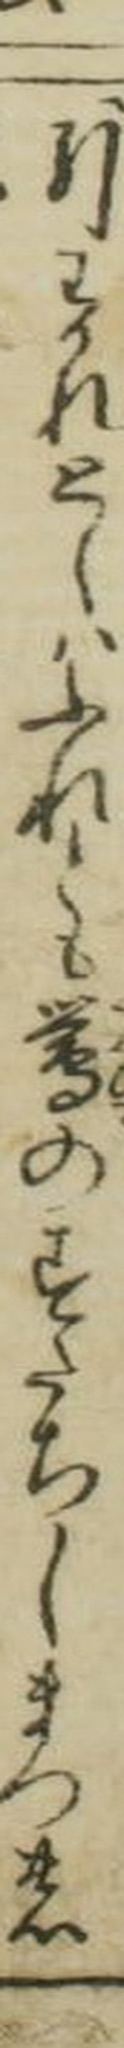〽引わかれとしはふれとも鶯のすたちしまつの
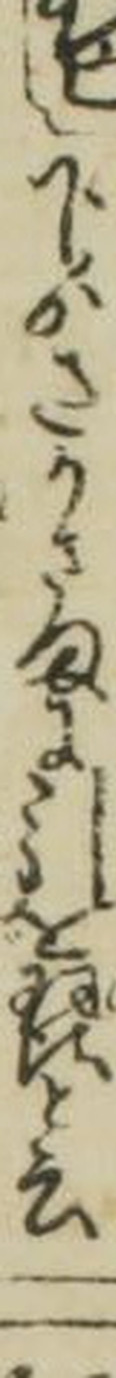下よりさかさまに引を琵と云
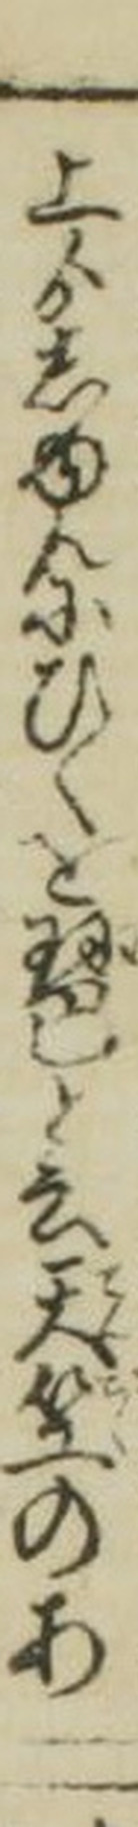上よりしゆんにひくを琶と云天竺のあ
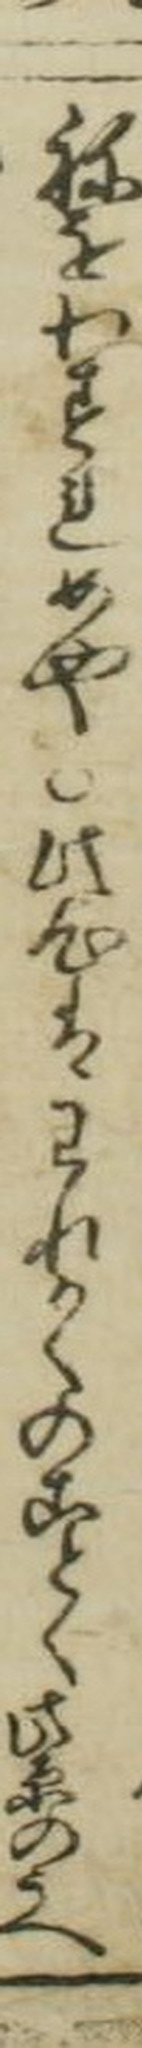ねをわすれめや○此心はわれかくのことく紫のうへ
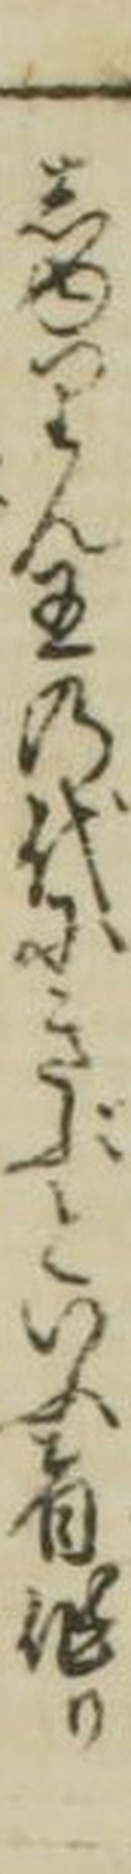しゆりん王の代にきぶといふ者作り
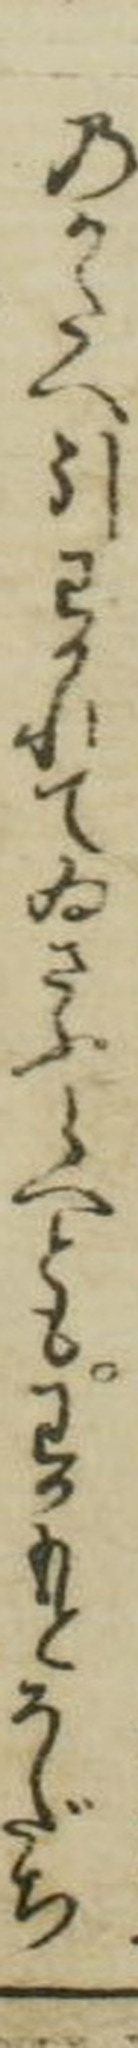のかたへ引わかれてゐさふらへとも。わかもとそだち
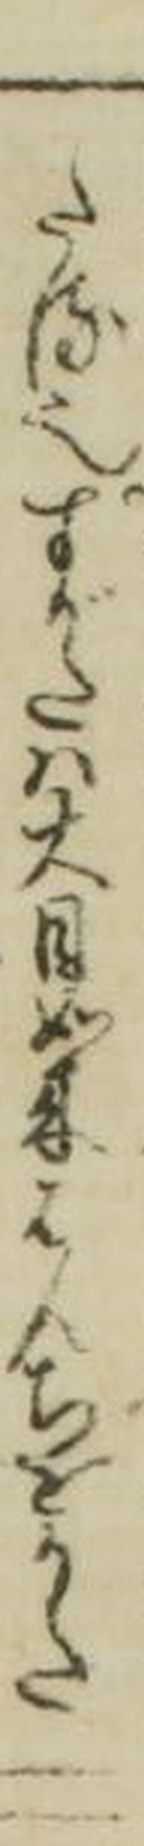たる也。すがたは大日如来はんちをかた
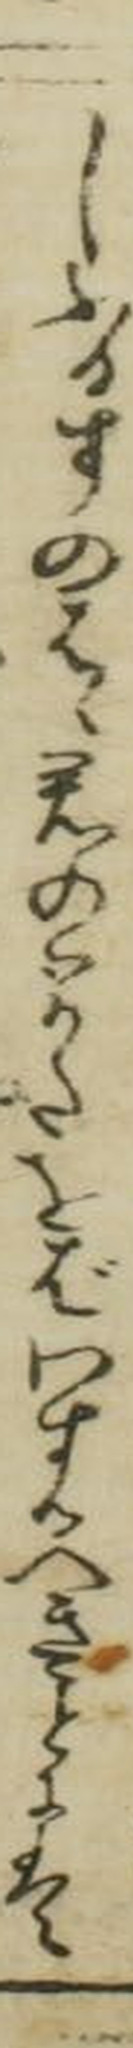しふるすのはゝ君の御かたをばわするへきことには
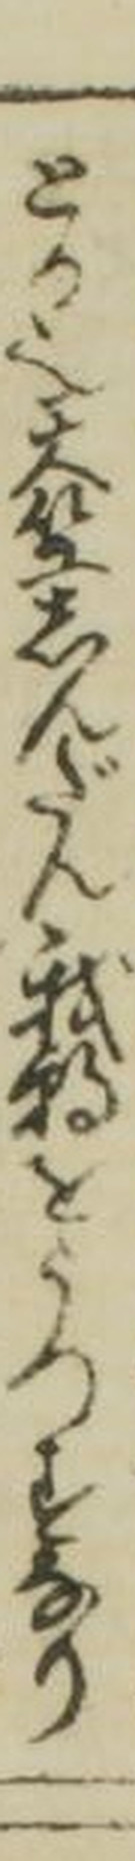とる也天竺しんだん我朝をうつすなり
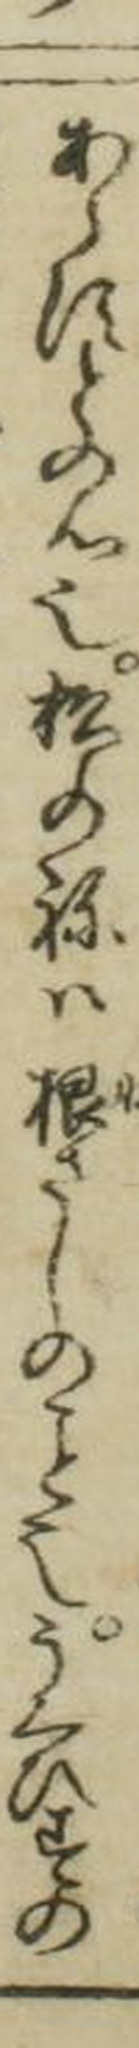あらすとの心也。松のねは根さしのこと也。うくひすの
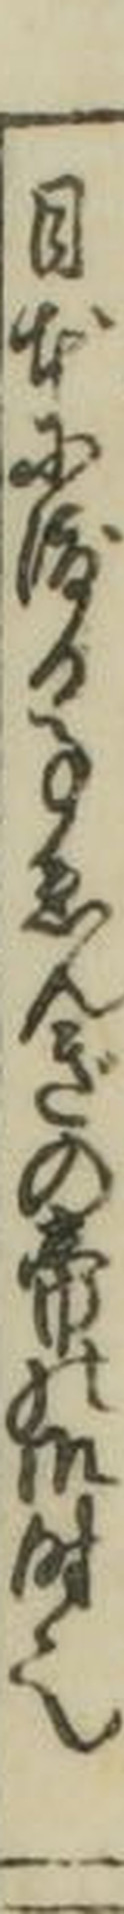日本に渡る事ゑんぎの帝の御時也
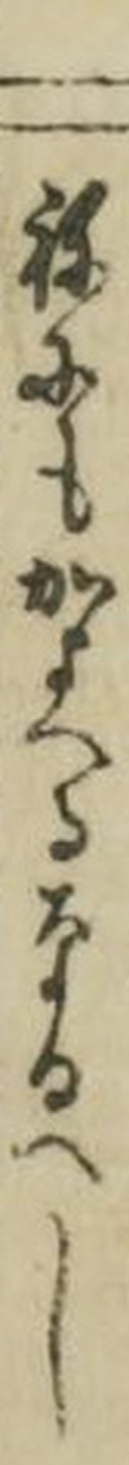ねにもかよへるなるへし
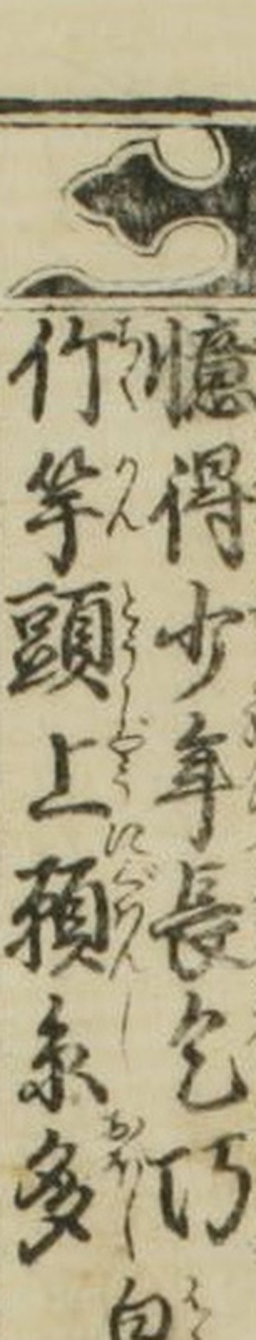竹竿頭上願糸多詩
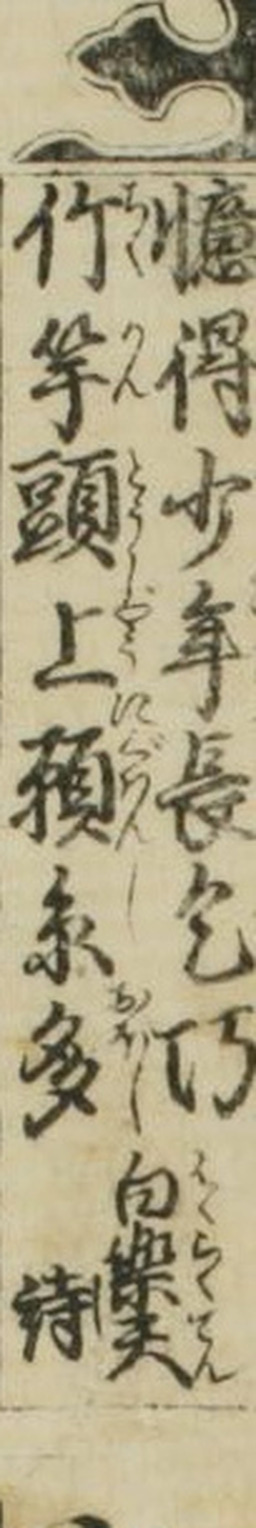竹竿頭上願糸多詩
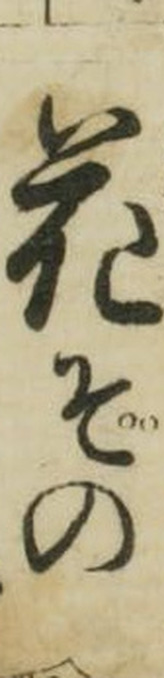花ぞの
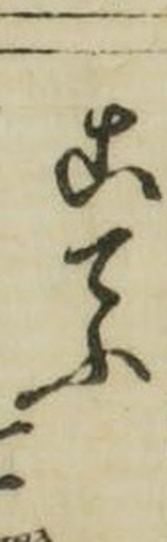こてふ
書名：女源氏教訓鑑
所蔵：東京学芸大学附属図書館
